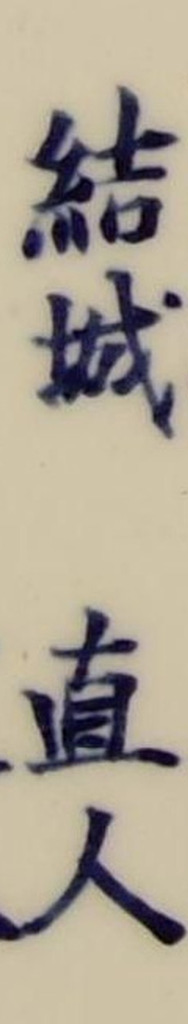結城直人
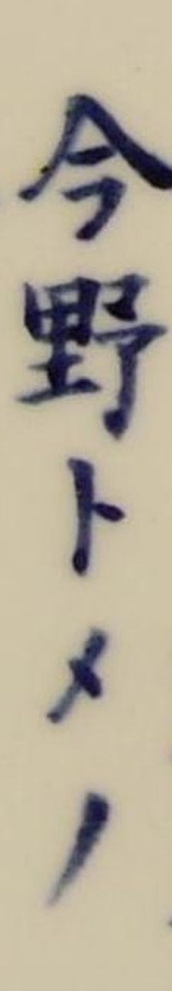今野トメノ
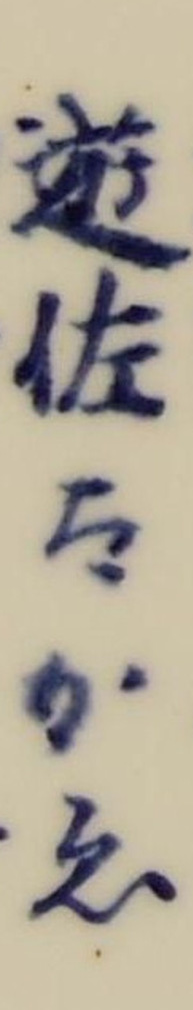遊佐たかゑ
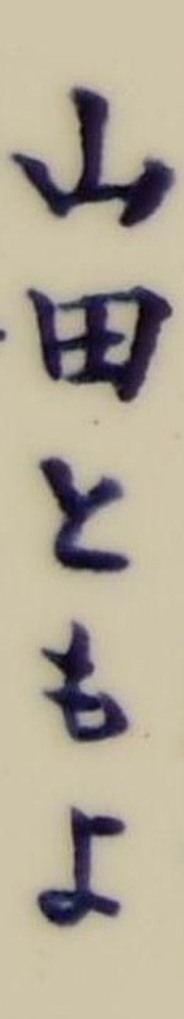山田ともよ
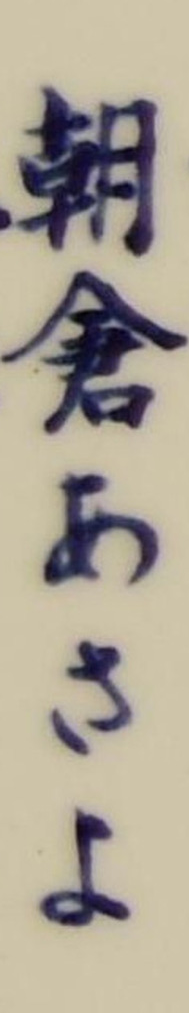朝倉あさよ
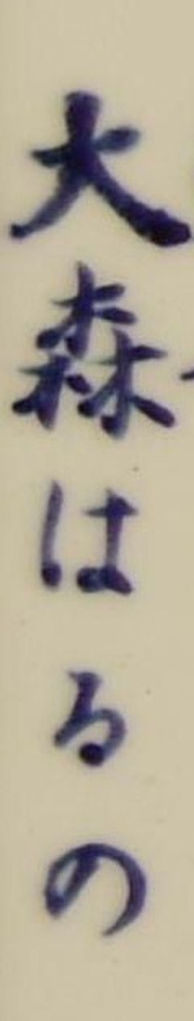大森はるの

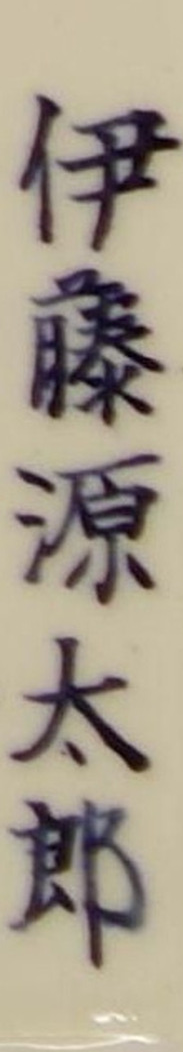伊藤源太郎
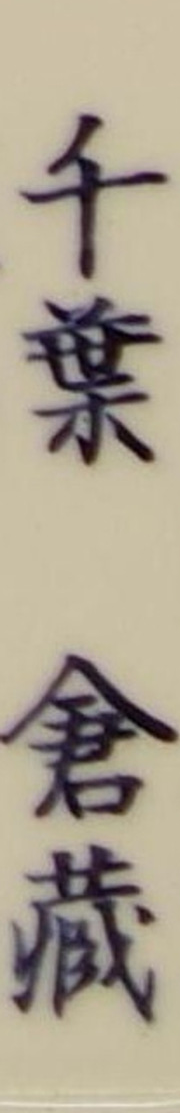千葉倉蔵
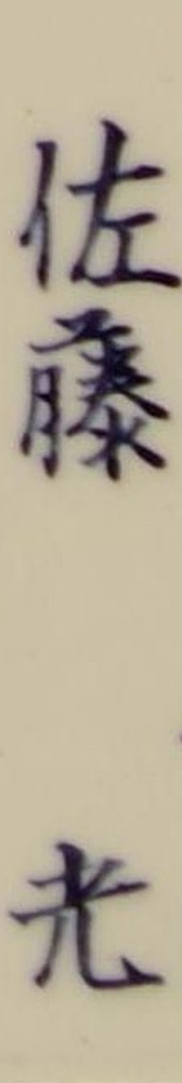佐藤光
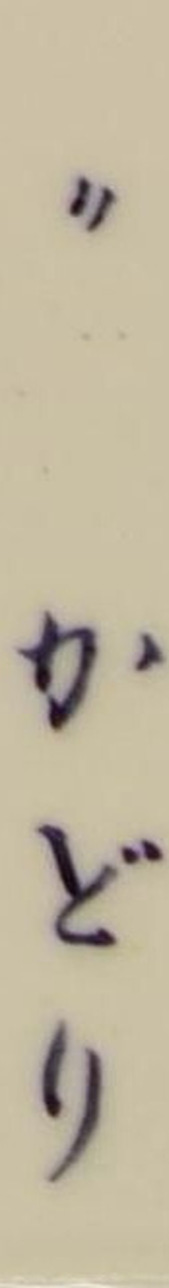かどり
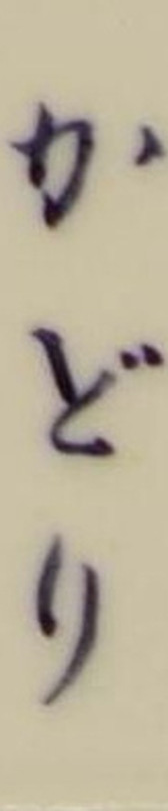かどり
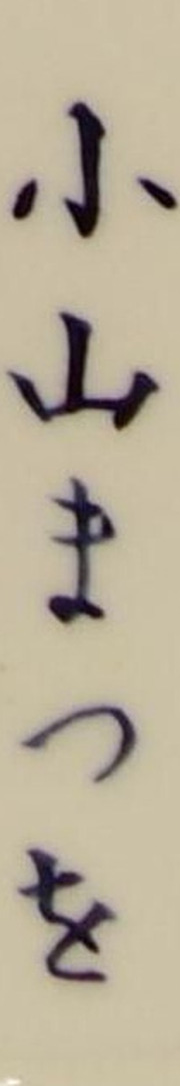小山まつを
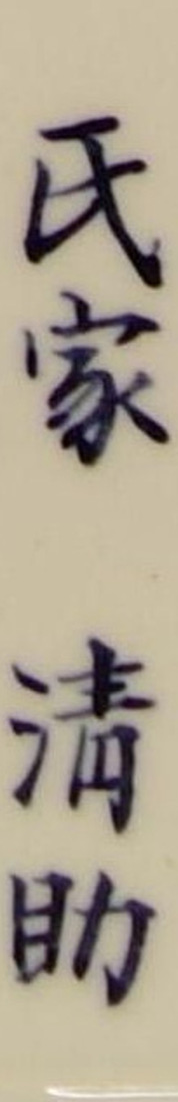氏家清助
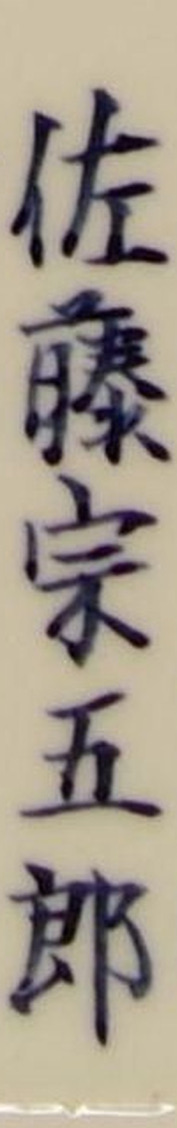佐藤宗五郎
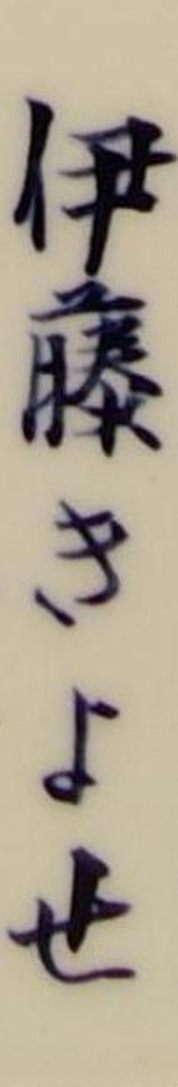伊藤きよせ
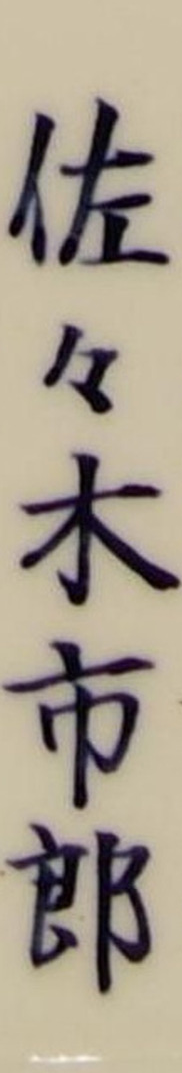佐々木市郎
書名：A~D
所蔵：koyasan kongobuji
